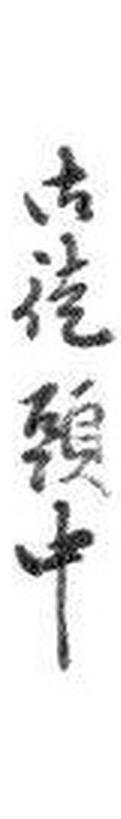御徒頭中
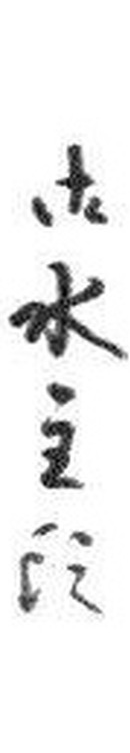御水主頭
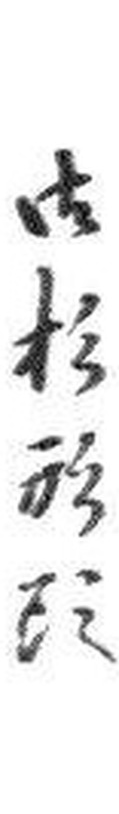御杉形頭

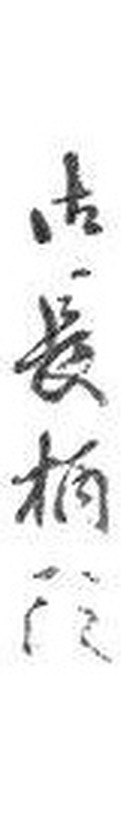御長柄頭
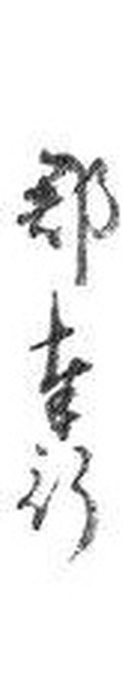郡奉行
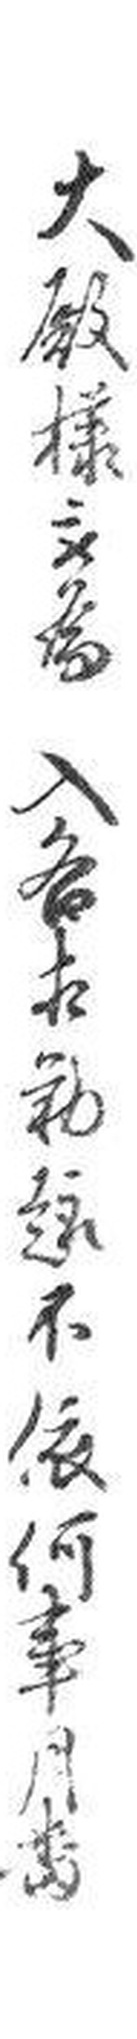大殿様被為入各相勤趣不依何事月番
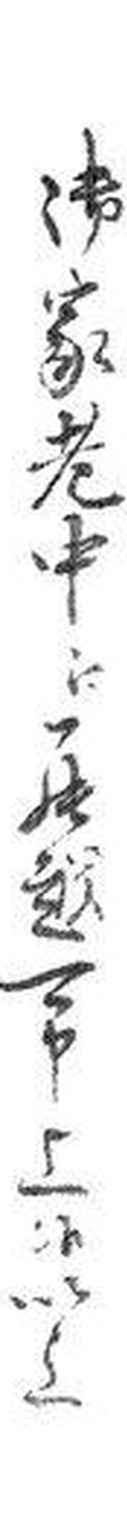御家老中江罷越可申上候以上
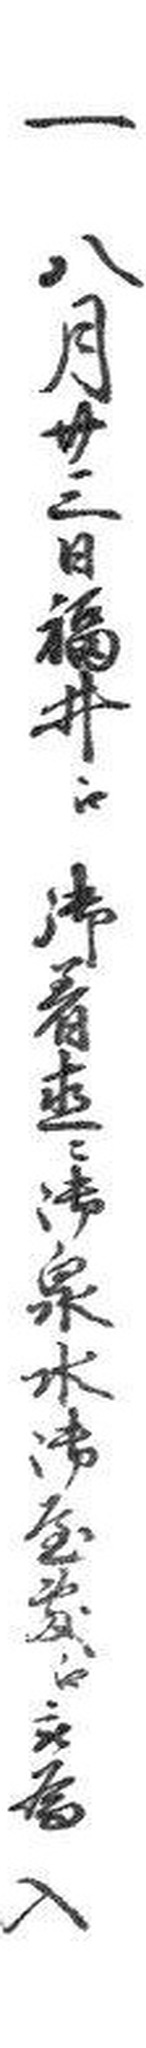一八月廿三日福井江御着直ニ御泉水御屋敷江被為入
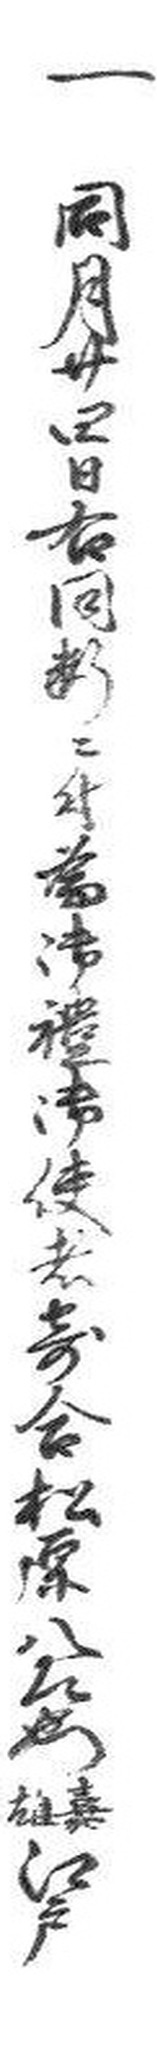一同月廿四日右同断ニ付為御礼御使者寄合松原八左衛門嘉雄江戸
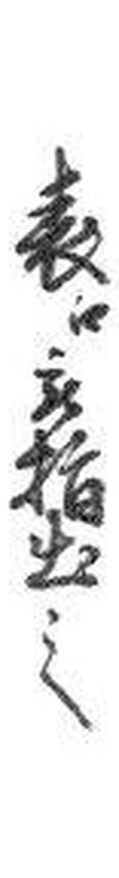表江被指出之
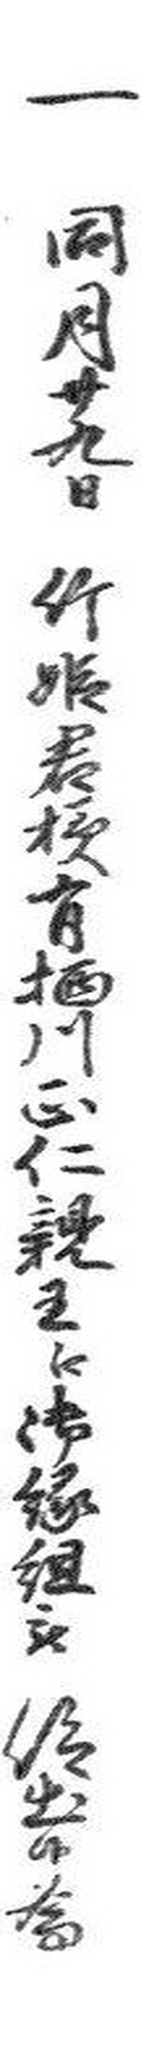一同月廿九日竹姫君様有栖川正仁親王江御縁組被仰出候為
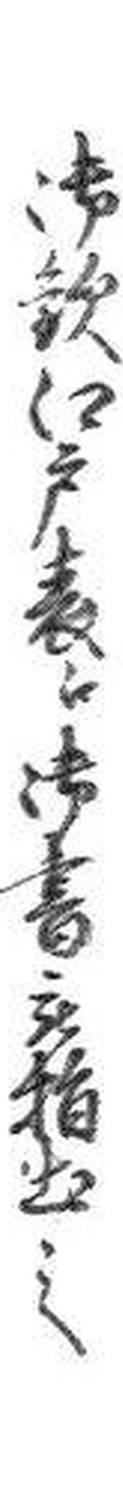御歓江戸表江御書被指出之
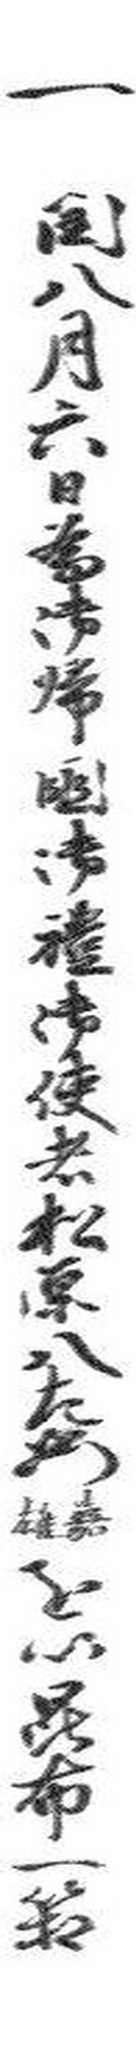一閏八月六日為御帰国御礼御使者松原八左衛門嘉雄を以昆布一箱
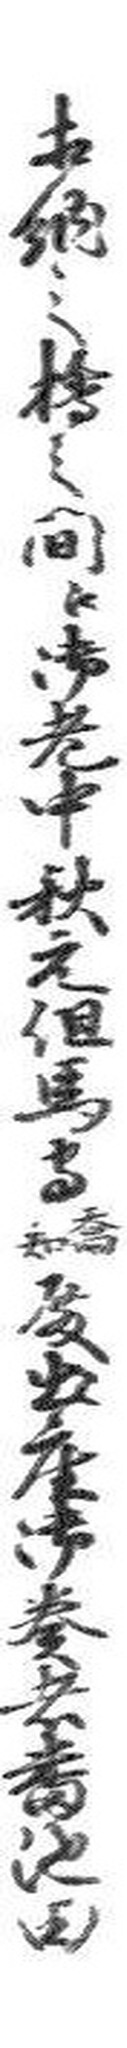相納之桧之間江御老中秋元但馬守喬知殿出座御奏者番池田
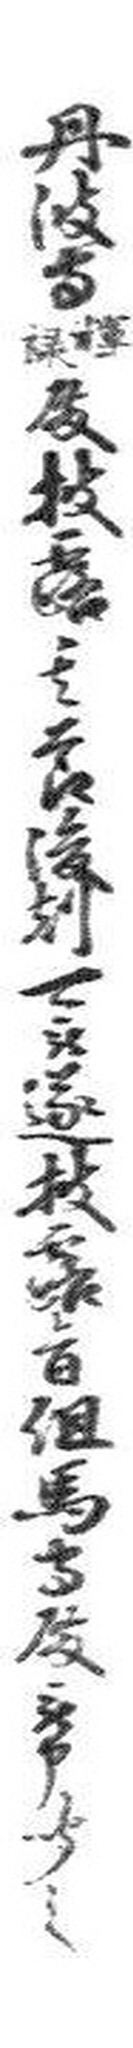丹波守輝禄殿披露其節後刻可被遂披露旨但馬守殿被申聞之
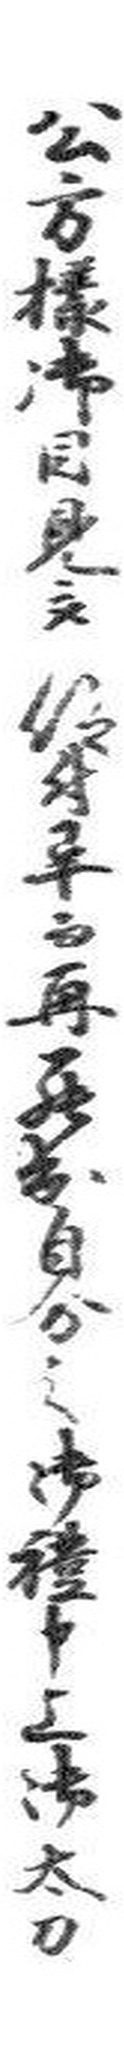公方様御目見被仰付畢而再罷出自分之御礼申上御太刀
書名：家譜 二十六 吉品公 従宝永七年到正徳二年
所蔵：福井県文書館 Fukui Prefectural Archives
